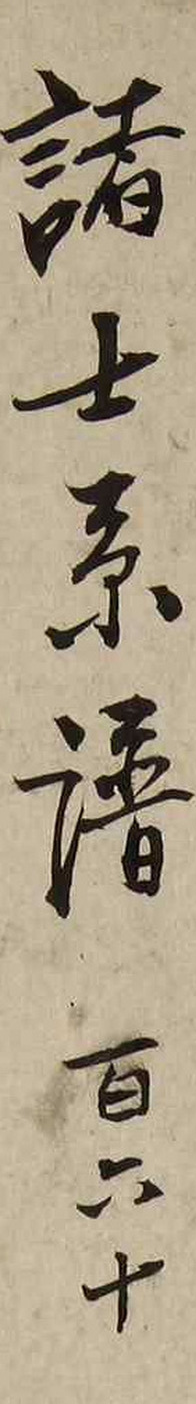諸士系譜百六十

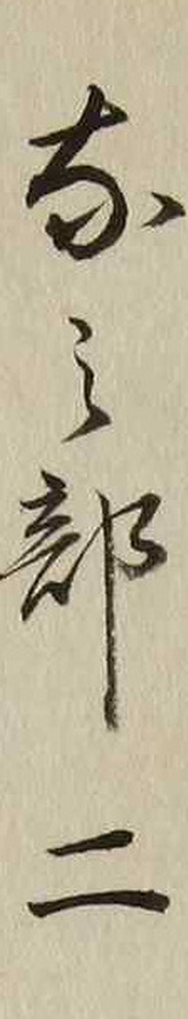なの部二
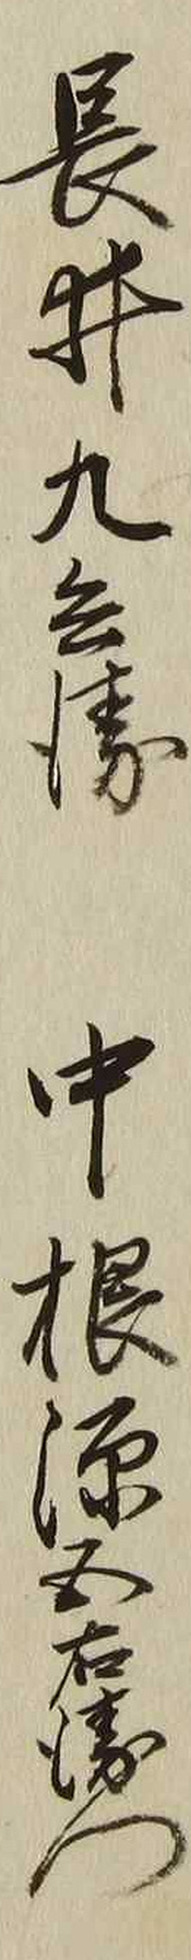長井九兵衛中根源五右衛門
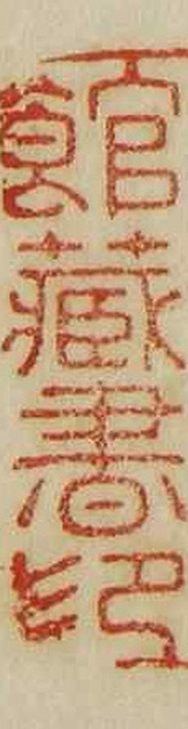館蔵書印

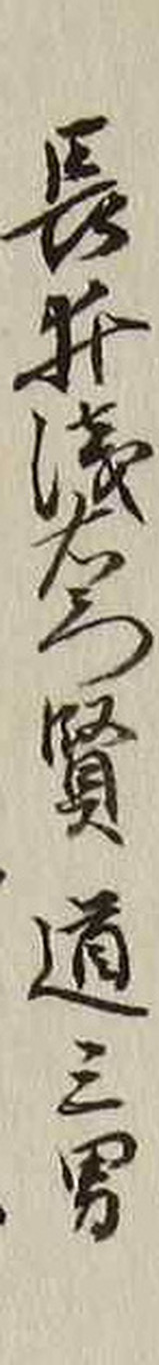長井浅右衛門賢道三男
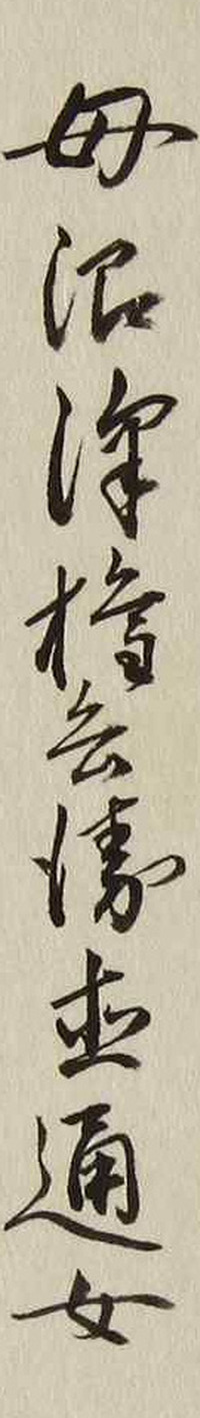母沼津権兵衛直道女
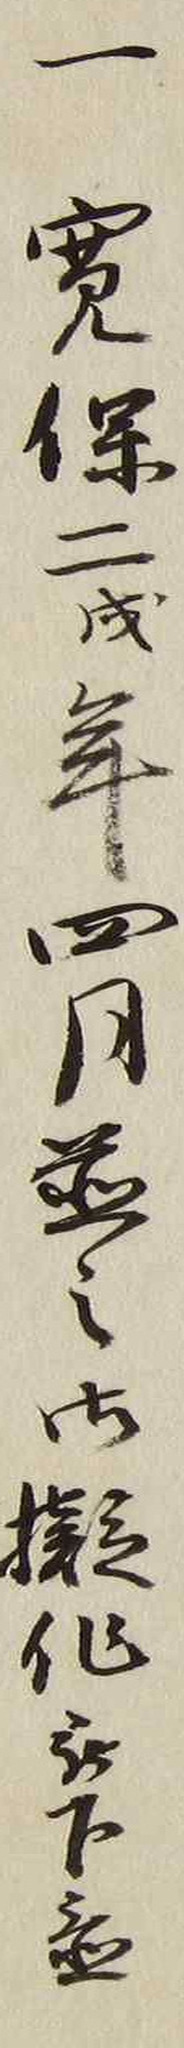一寛保二戌年四月並之御擬作被下置
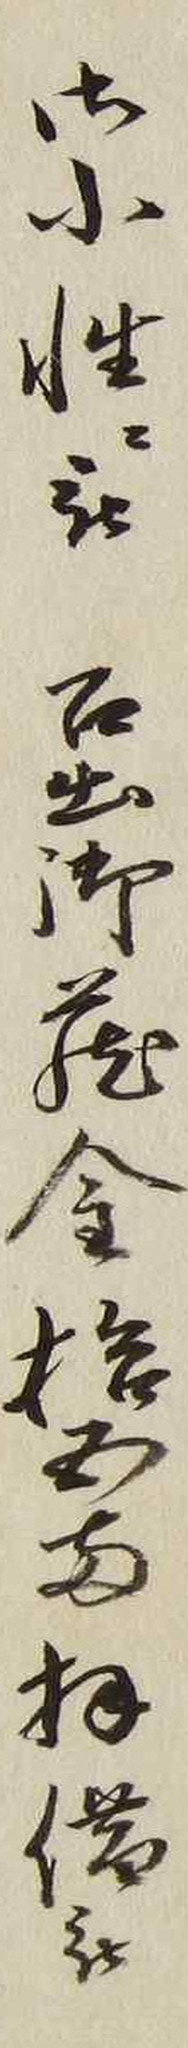御小性ニ被召出御蔵金拾五両拝借被

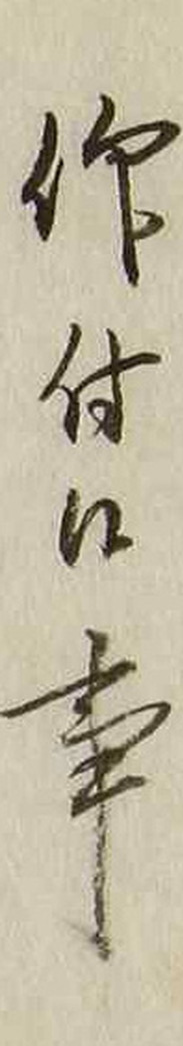仰付候事
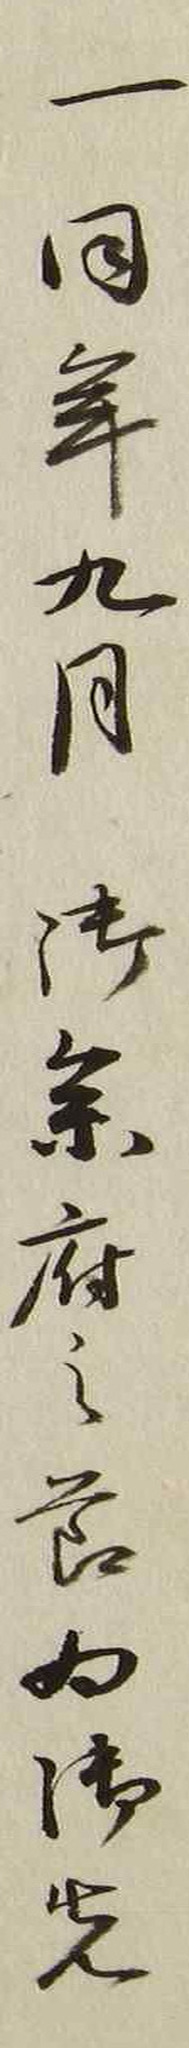一同年九月御参府之節為御先
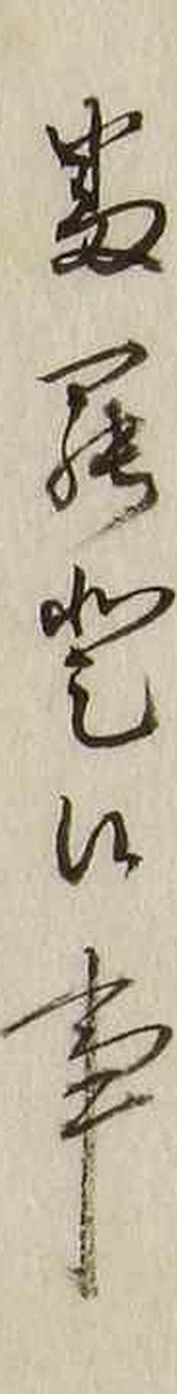番罷登候事
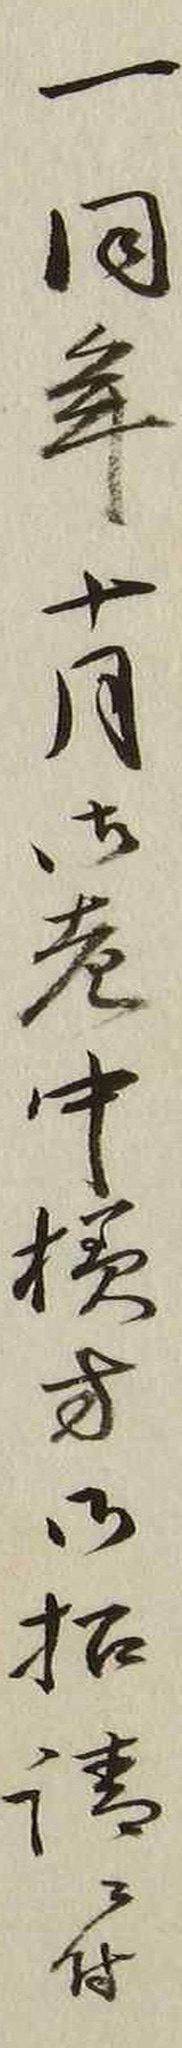一同年十月御老中様方御招請ニ付
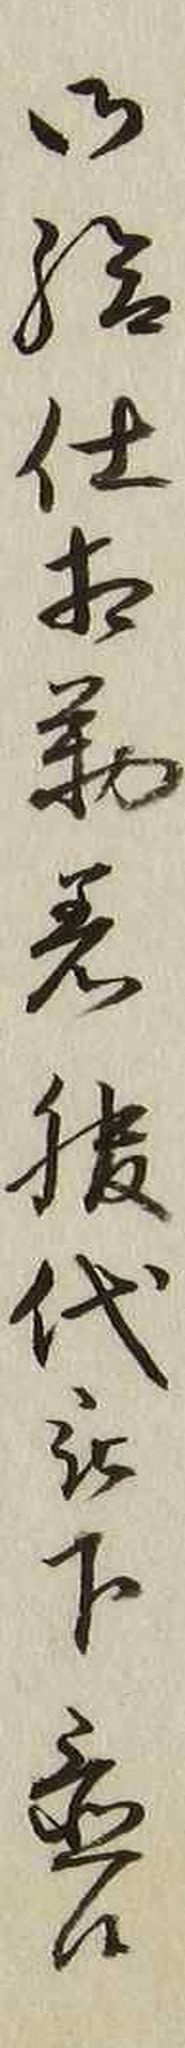御給仕相勤着服代被下置候
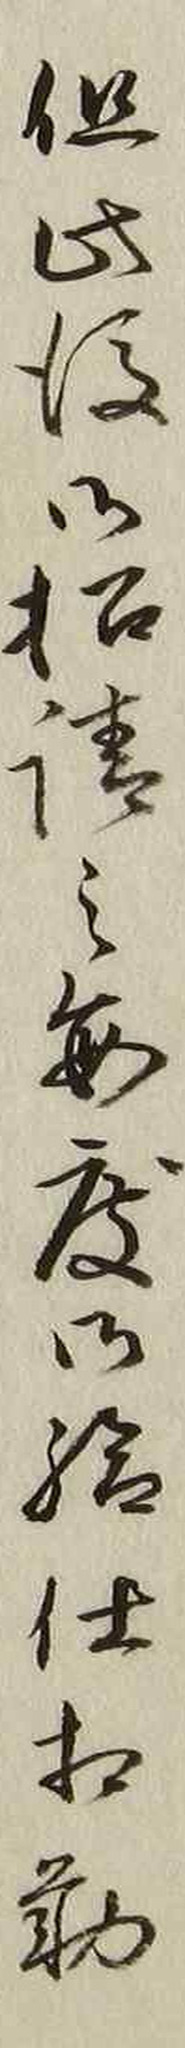但此後御招請之毎度御給仕相勤
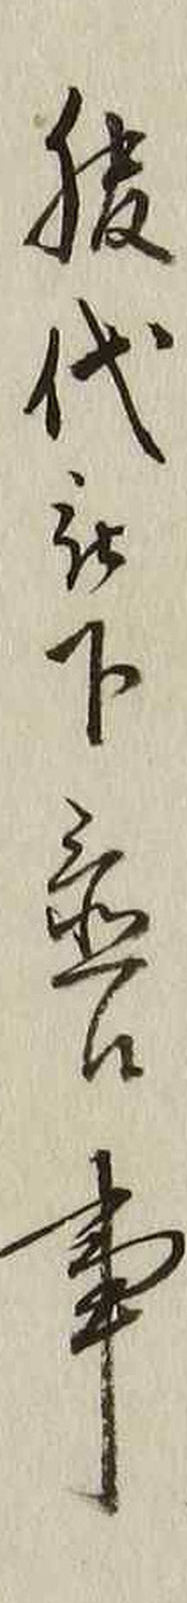服代被下置候事
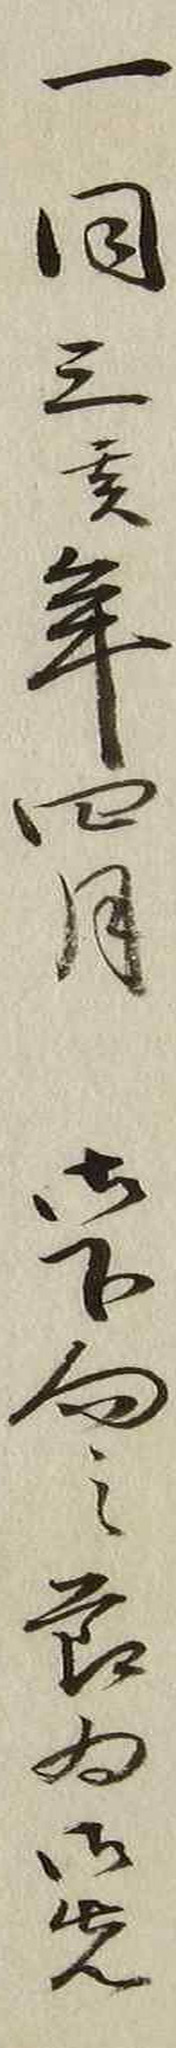一同三亥年四月御下向之節為御先
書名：諸士系譜　巻之160　な之部2
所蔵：会津若松市立会津図書館
